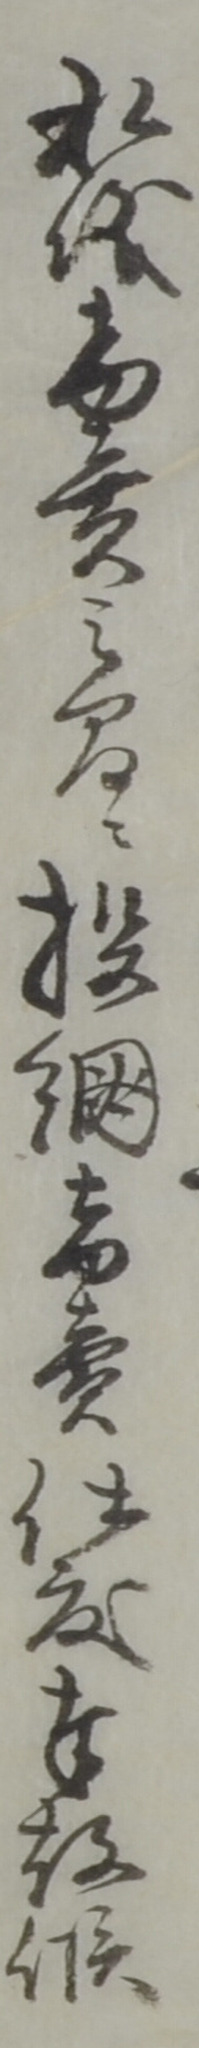私儀商売之間ニ投網商売仕度奉存候
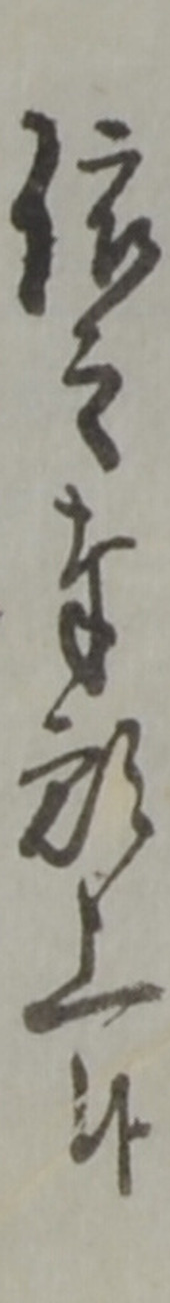依之奉願上候
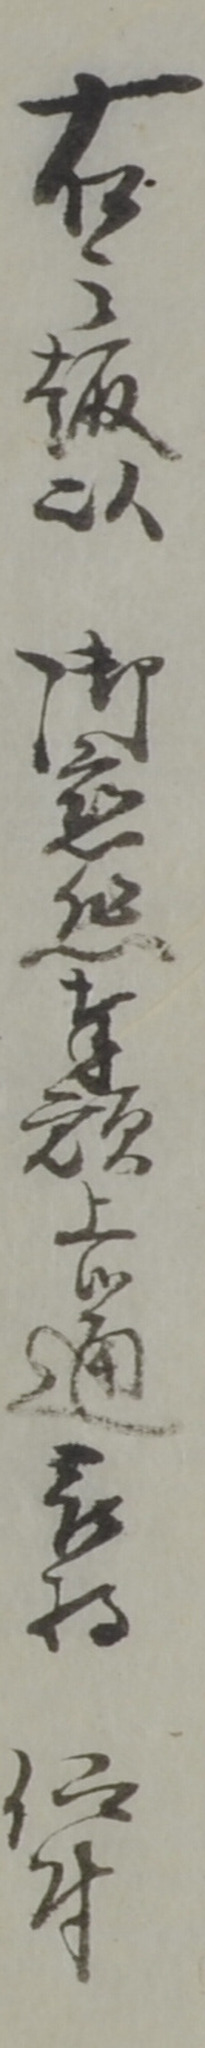右之趣以御慈悲奉願上候通被為仰付
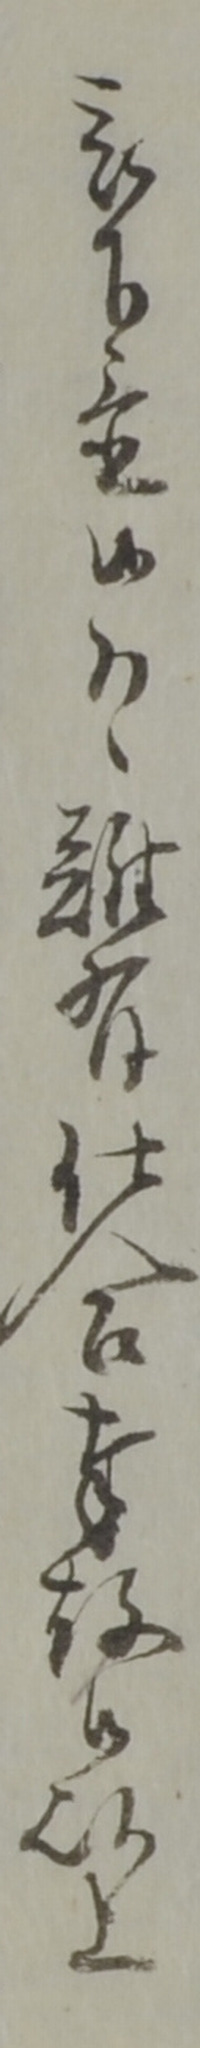被下置候ハヽ難有仕合奉存候以上
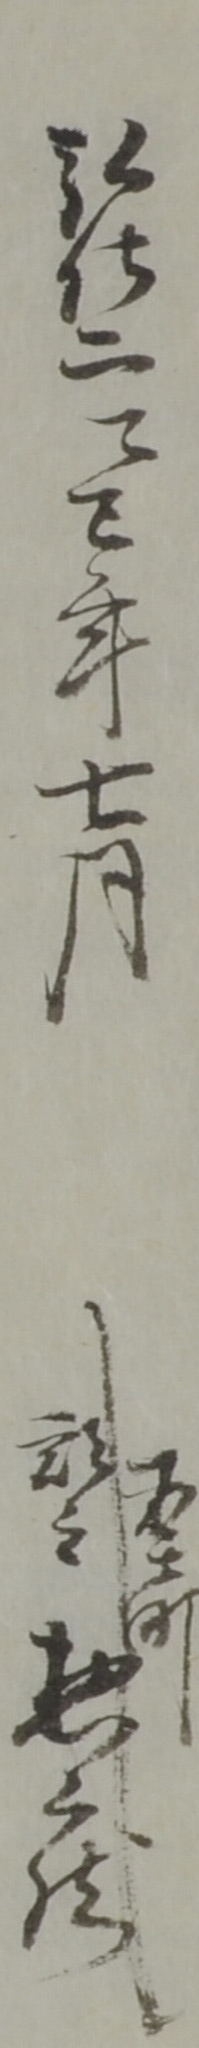弘化二乙巳年七月願主惣兵衛
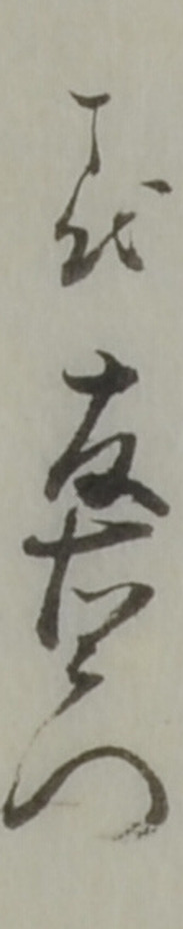丁代友右衛門
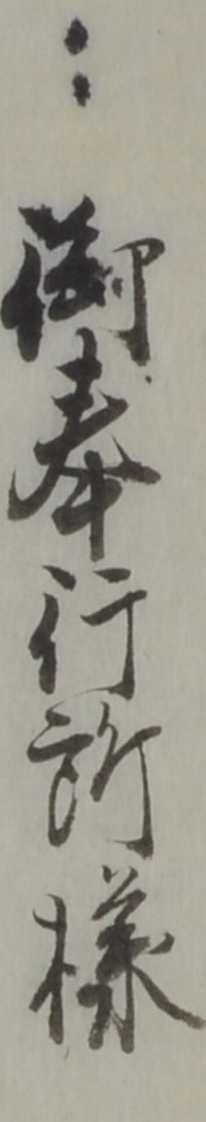御奉行所様
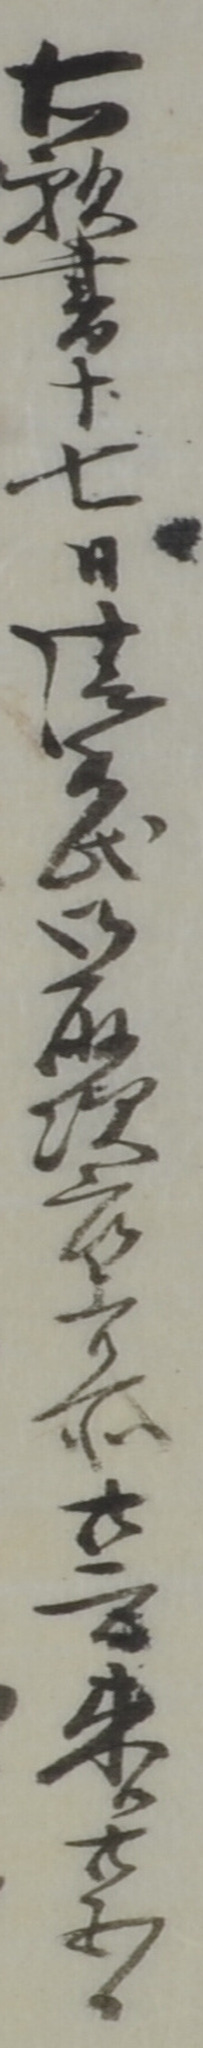右願書十七日清水氏御取次差上候所廿二日来ル廿五日
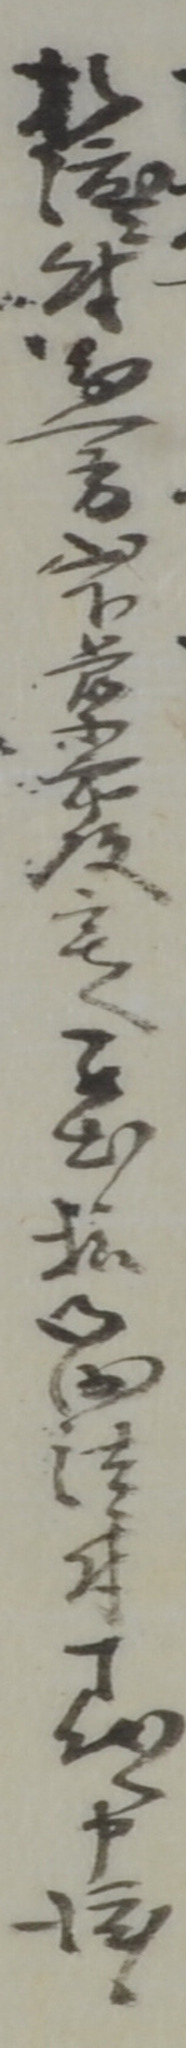札渡ニ付分一方山下常五郎殿宅へ罷出候様御沙汰ニ付丁代へ申渡候
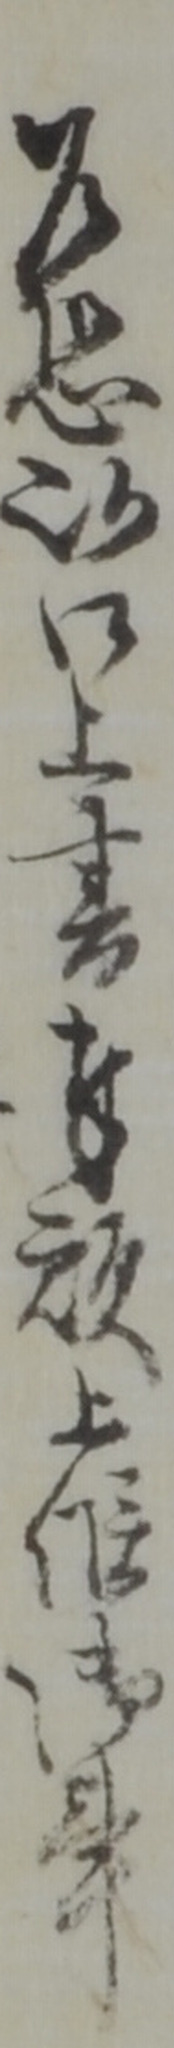乍恐以口上書奉願上候御事
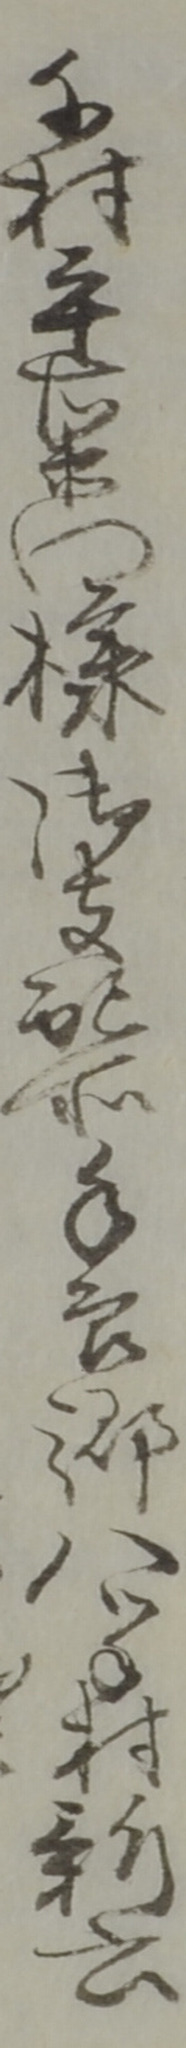千村平右衛門様御支配所手良郷八ツ手村新六
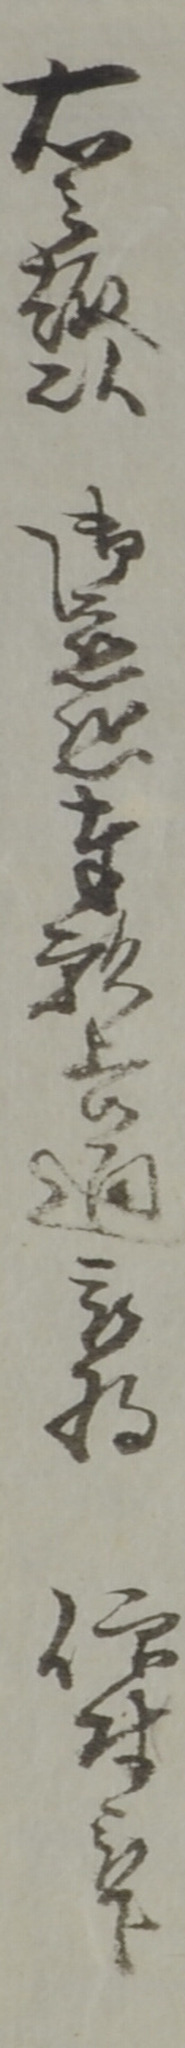右之趣以御慈悲奉願上候通被為仰付被下
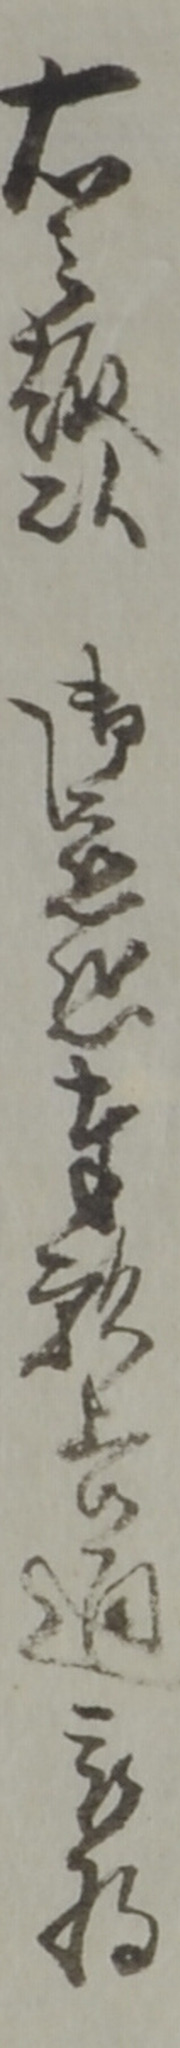右之趣以御慈悲奉願上候通被為仰付
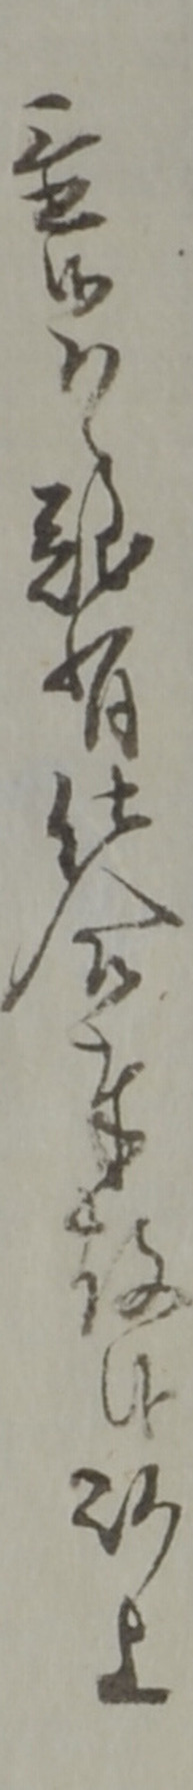被下置候ハヽ難有仕合奉存候以上
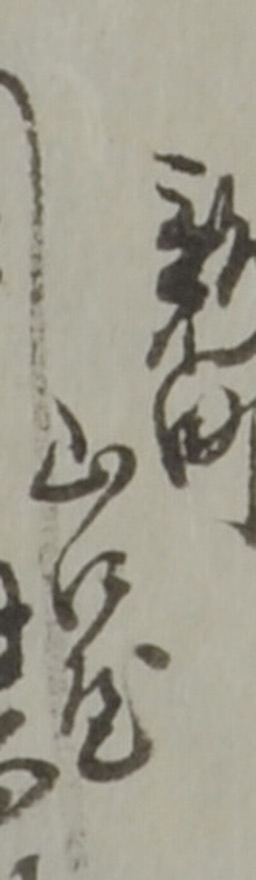山口屋
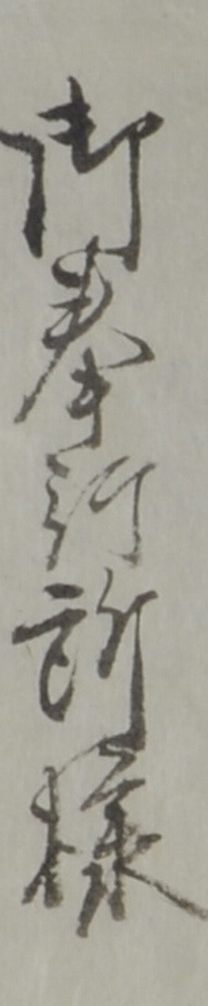御奉行所様
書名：諸願書控簿
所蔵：伊那市立高遠町図書館・合同会社AMANE
